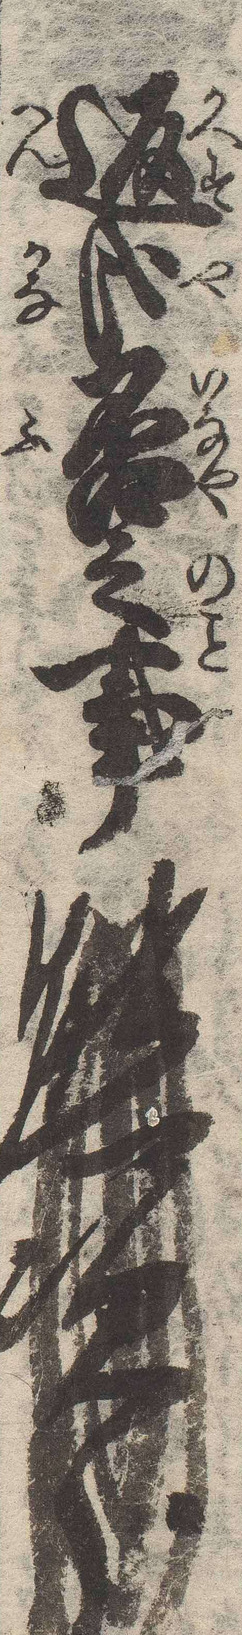返哉否之事
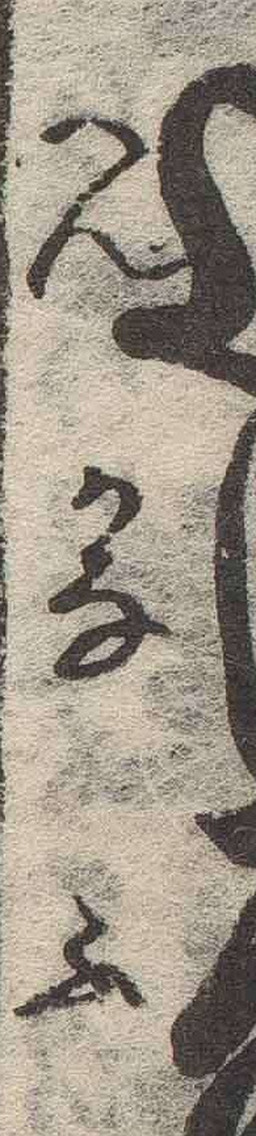へんかなふ
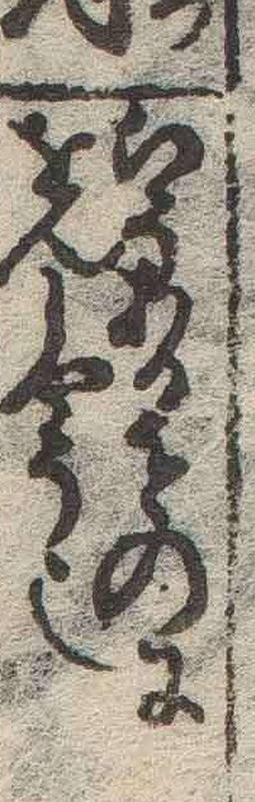をんしやう也
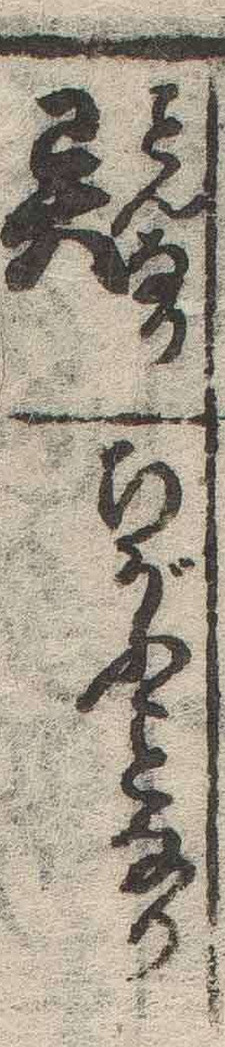異ちがふことなり
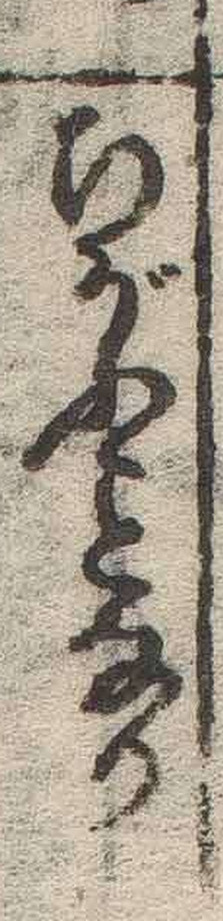異ちがふことなり
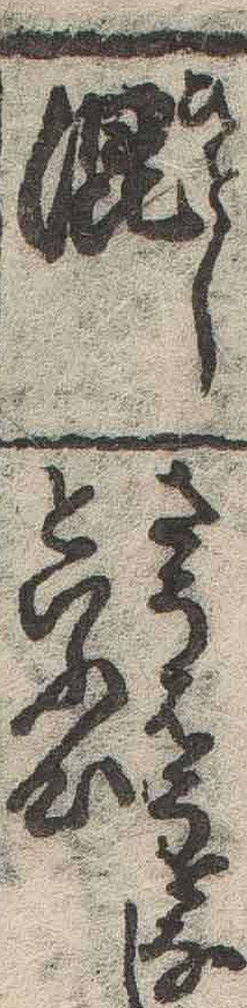といふ心
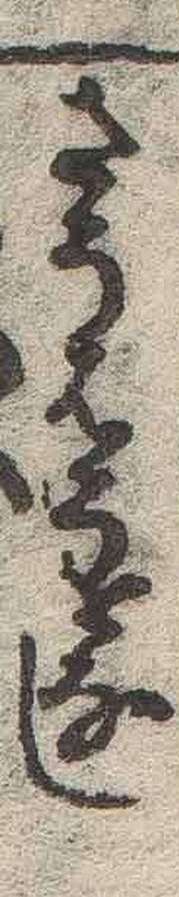混さうはうをなし
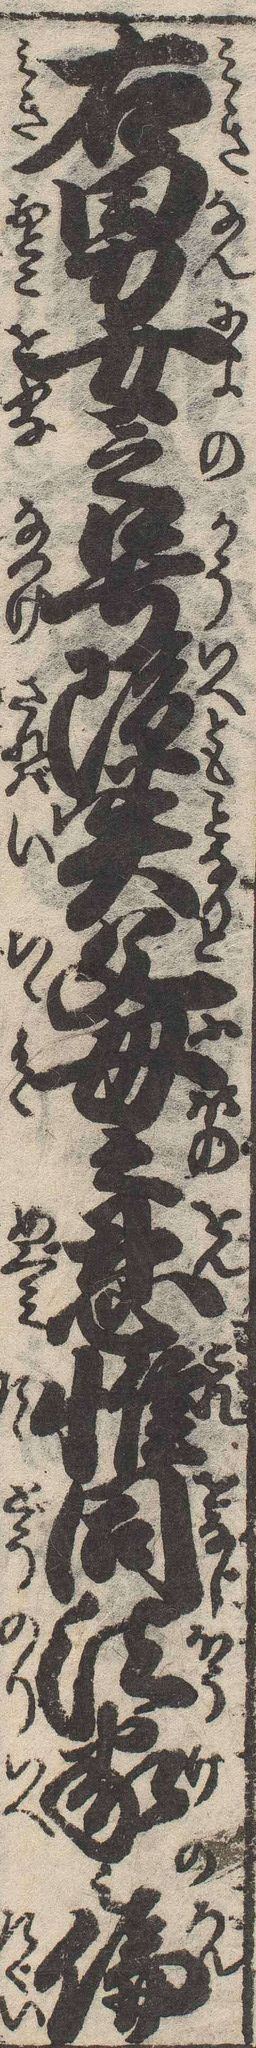右男女之号雖異父母之恩惟同法家之論
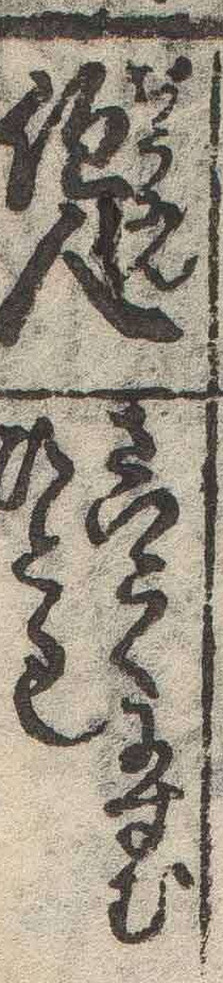住人さいこくにすむ
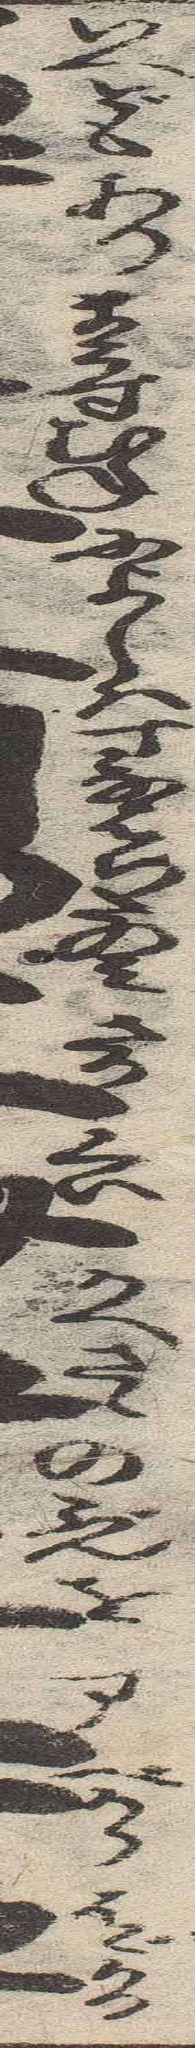いへどもありまうすむねによしはすなはちたのみさるくいかへさしのぶんをすべからはゞかり
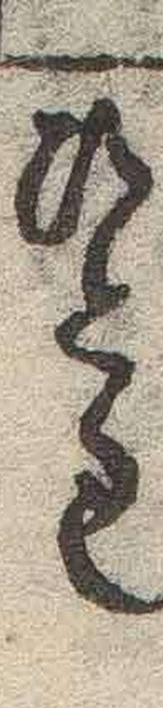ひと也
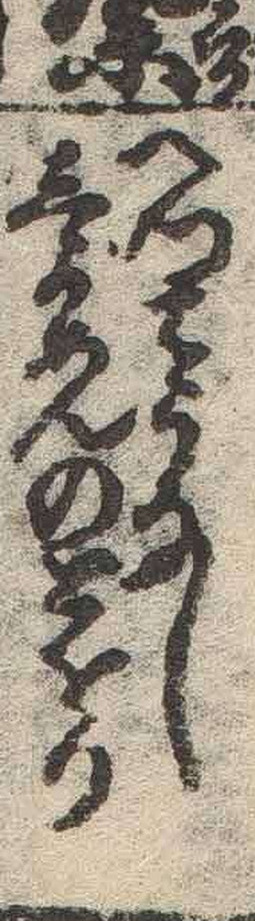しよめんのとをり
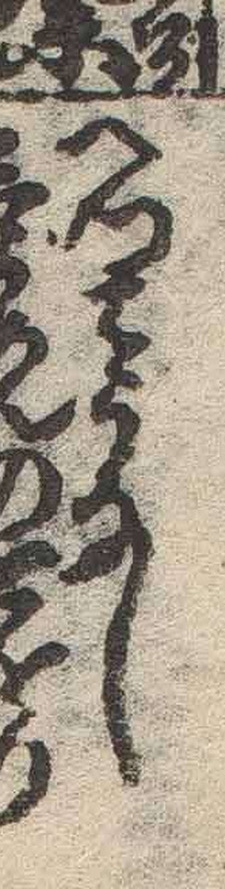しよめんのとをり
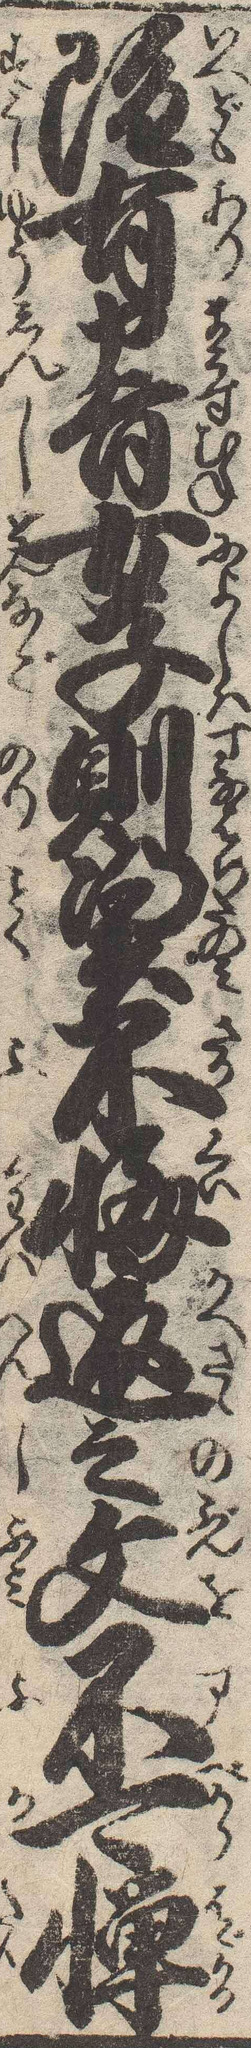雖有申旨女子則資不悔返之文不可憚
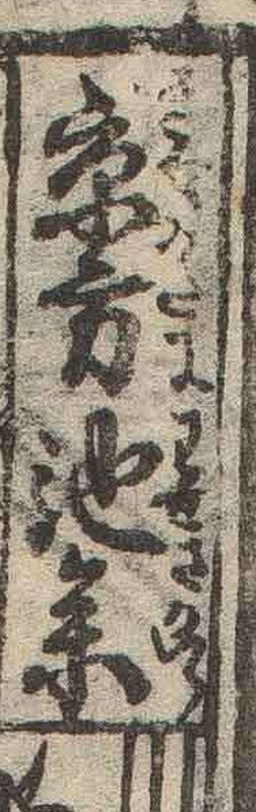京方馳参
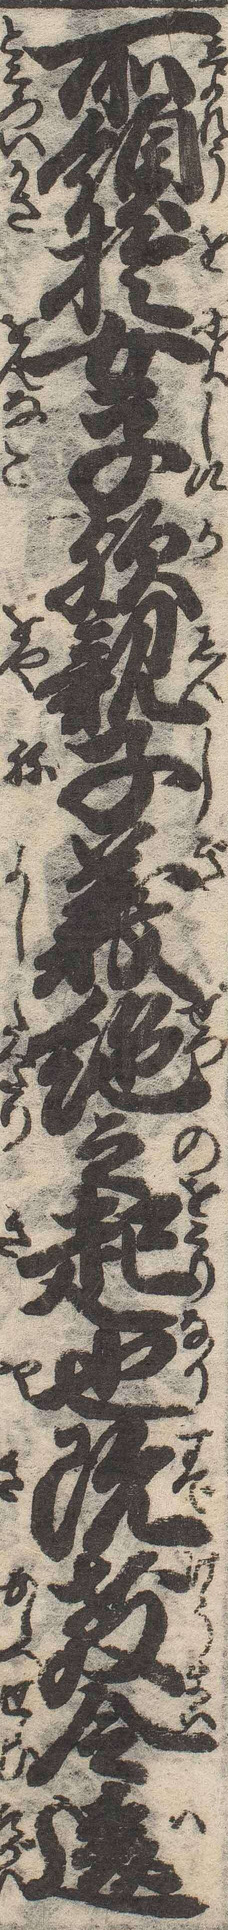所領於女子欤親子義絶之起也既教令違
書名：御成敗式目絵抄
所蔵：東京学芸大学附属図書館 国文学研究資料館
